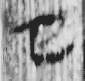巳
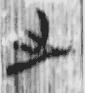之
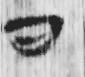日
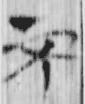不
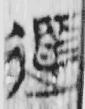𬨭（將）
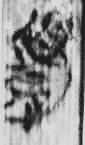○（喜）
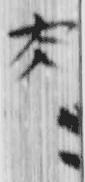大夫
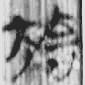○（胡）
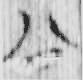公
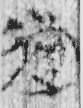○（旅）
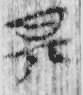○（期）
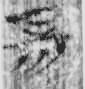昜（陽）
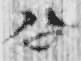公
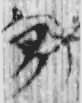穆
